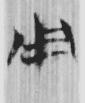用
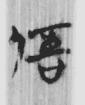俉
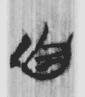頁
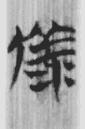備
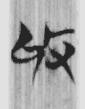收
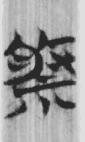祭
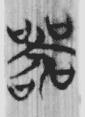器
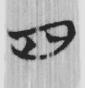四
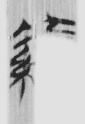羅
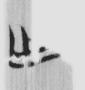乍
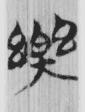樂
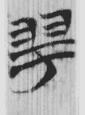{羽于}
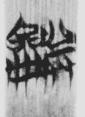{𠎤𠔉}
